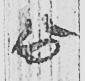公
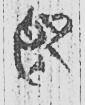即
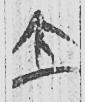立
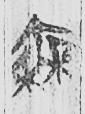秦
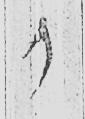人
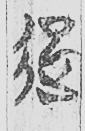起
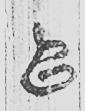𠂤
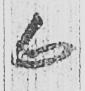㠯（以）
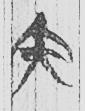內
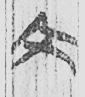文
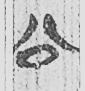公
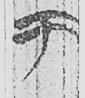于
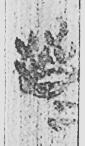晉=
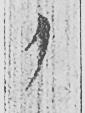人
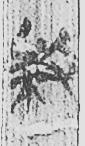殺
